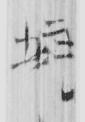堋
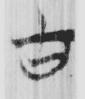古
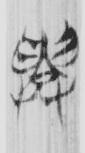興
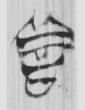善
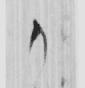人
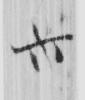必
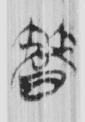{竹亯}
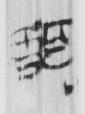䎽
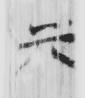亓
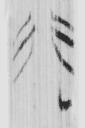行
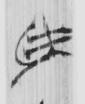𡚦
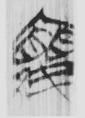雚
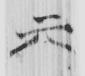亓
